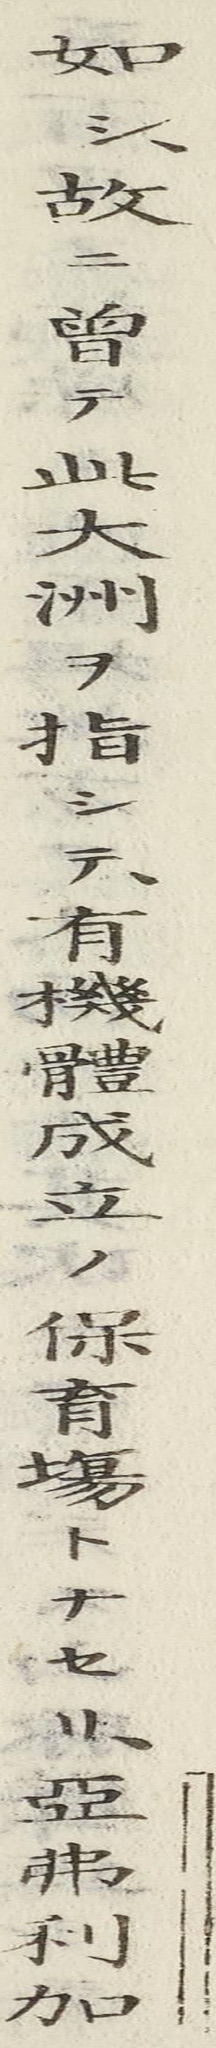如シ、故ニ曾テ此大洲ヲ指シテ、有機体成立ノ保育場トナセリ、阿弗利加
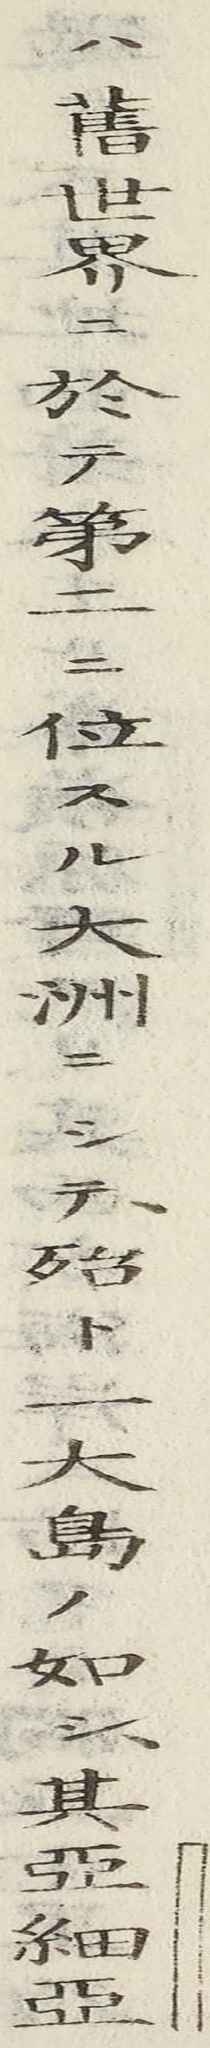ハ旧世界ニ於テ第二ニ位スル大洲ニシテ、殆ト一大島ノ如シ、其亜細亜
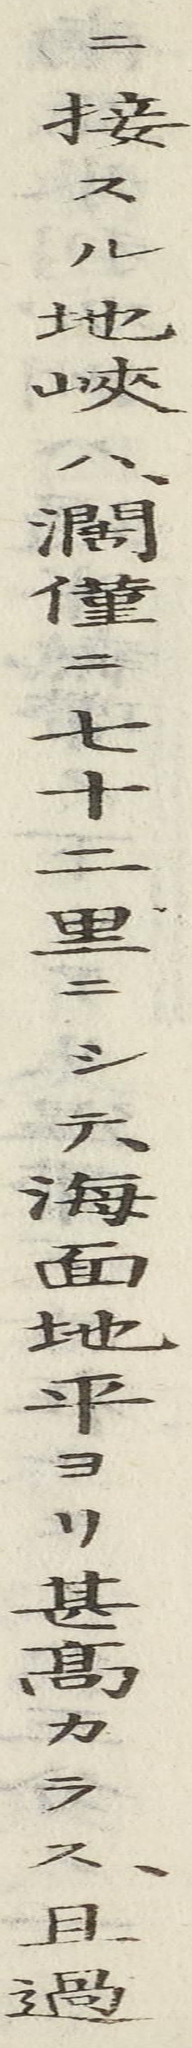ニ接スル地峡ハ、濶僅ニ七十二里ニシテ、海面地平ヨリ甚高カラス、且過
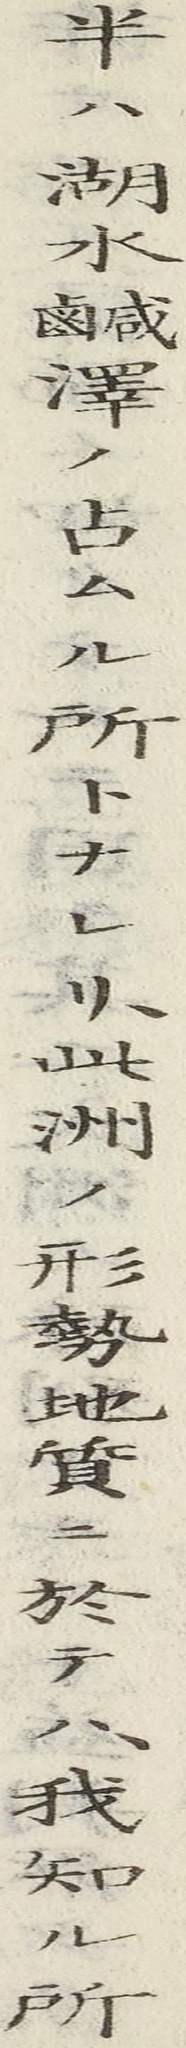半ハ湖水鹹沢ノ占ムル所トナレリ、此洲ノ形勢地質ニ於テハ、我知ル所
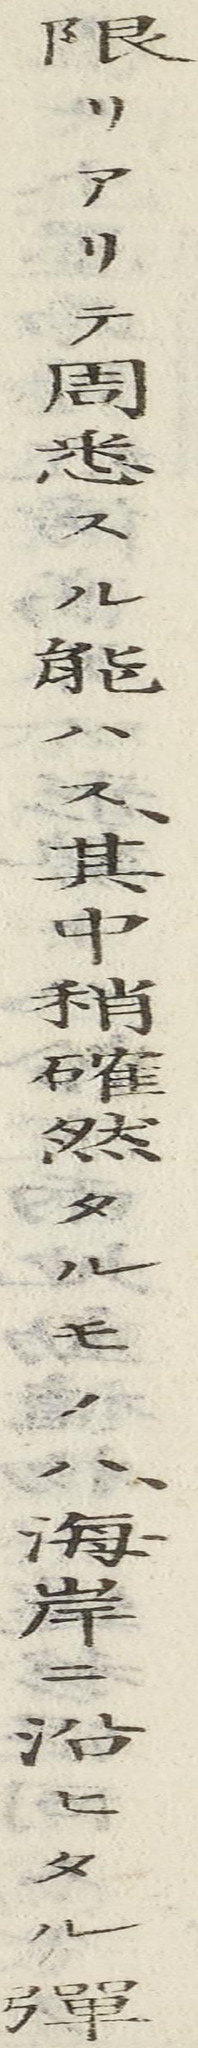限リアリ周悉スル能ハス、其中稍確然タルモノハ、海岸ニ沿ヒタル弾
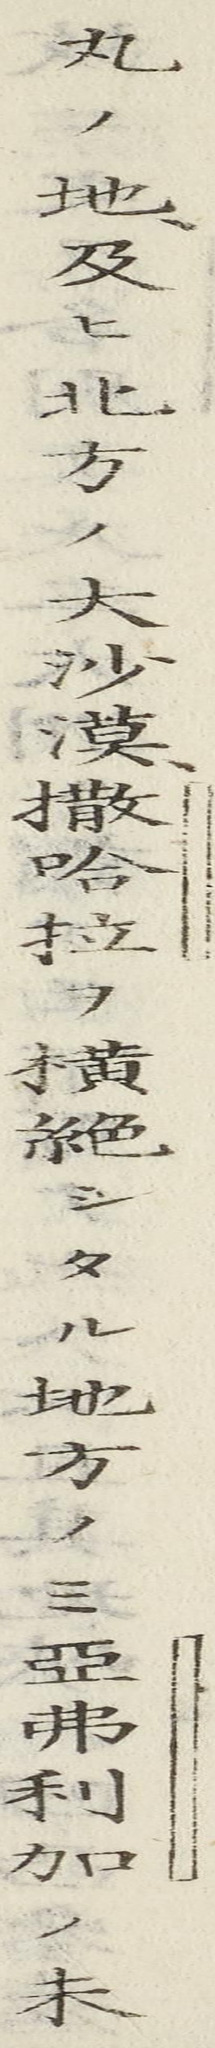丸ノ地、及ヒ北方ノ大沙漠、撒哈拉ヲ横絶シタル地方ノミ阿弗利加ノ未
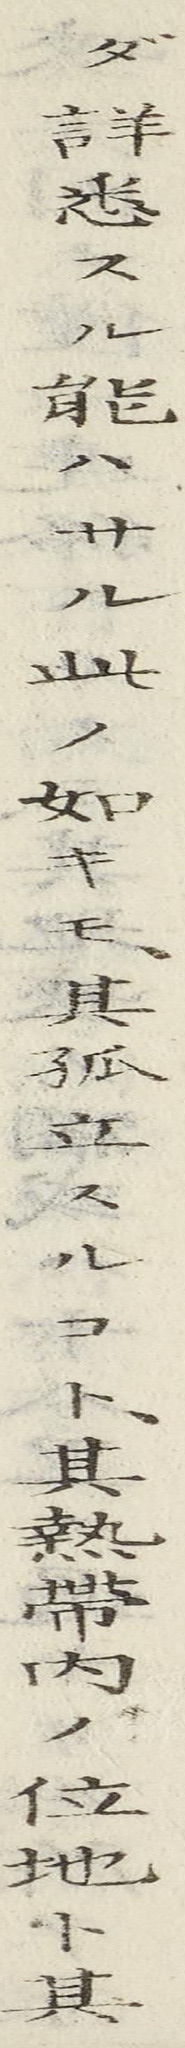ダ詳悉スル能ハサル此ノ如キモ、其孤立スルコト、其熱帯内ノ位地ト其
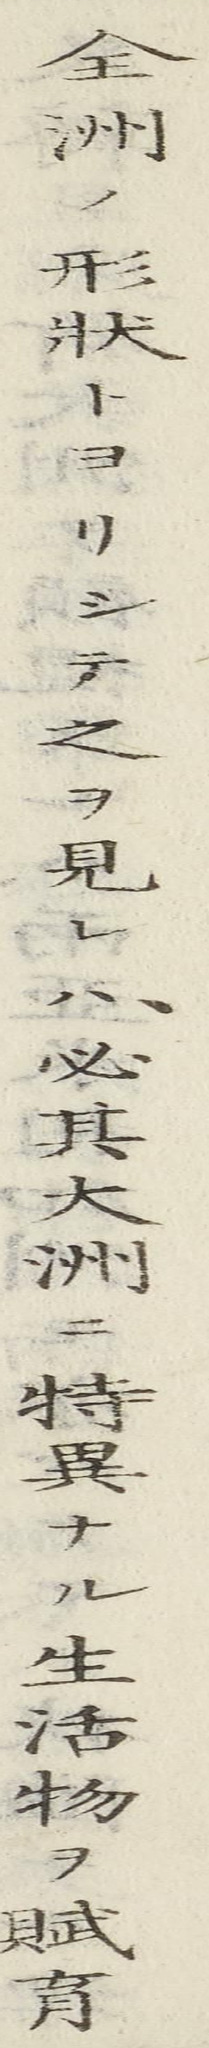全洲ノ形状トヨリシテ之ヲ見レハ、必其大洲ニ特異ナル生活物ヲ賦育
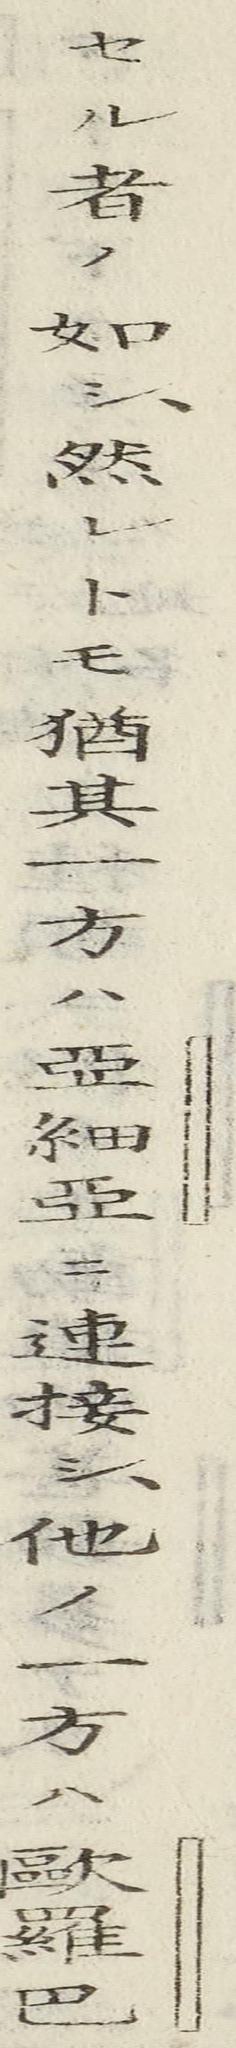セル者ノ如シ、然レトモ猶其一方ハ亜細亜ニ連接シ、他ノ一方ハ欧羅巴
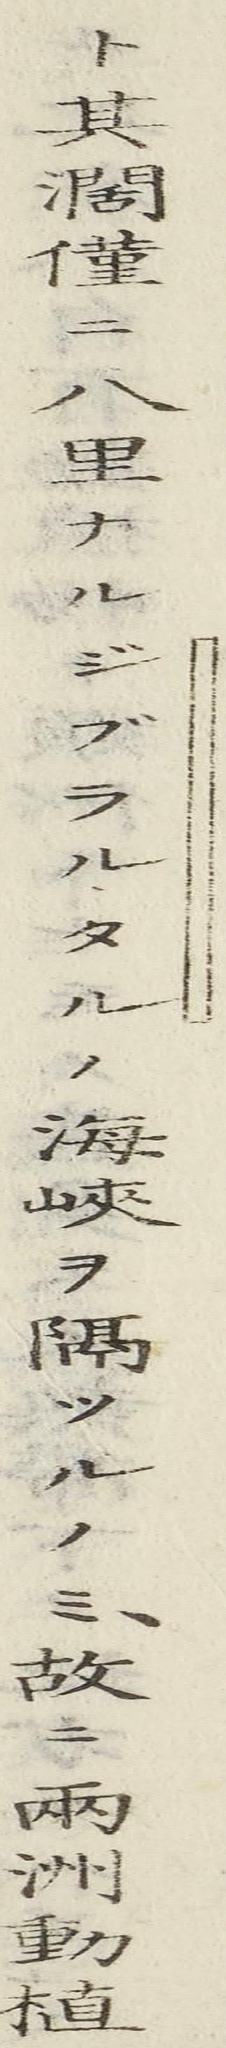ト其濶僅ニ八里ナルジブラルタルノ海峡ヲ隔ツルノミ、故ニ両洲動植
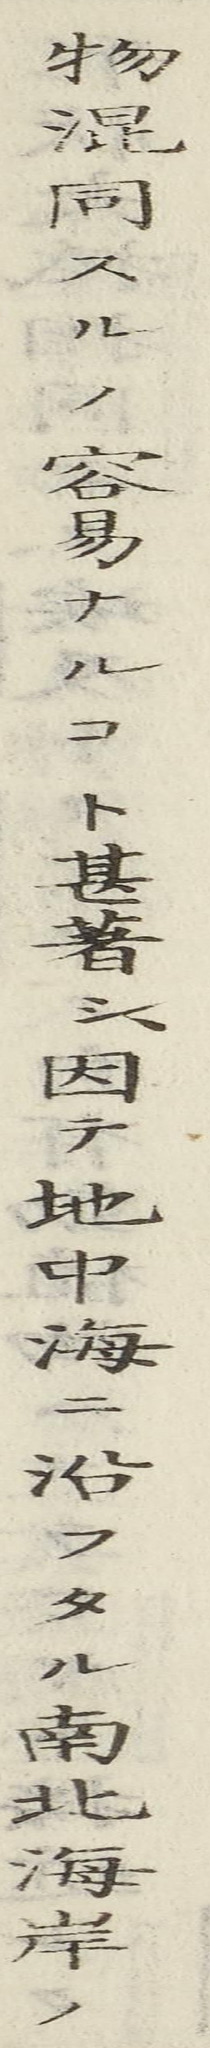物混同スルノ容易ナルコト甚著シ、因テ地中海ニ沿フタル南北海岸ノ

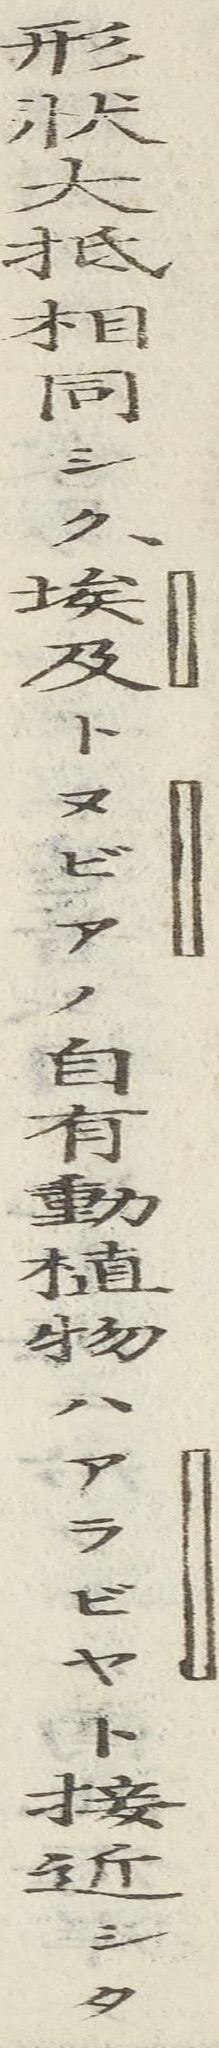形状大抵相同シク、埃及トヌビアノ自有動植物ハアラビヤト接近シタ
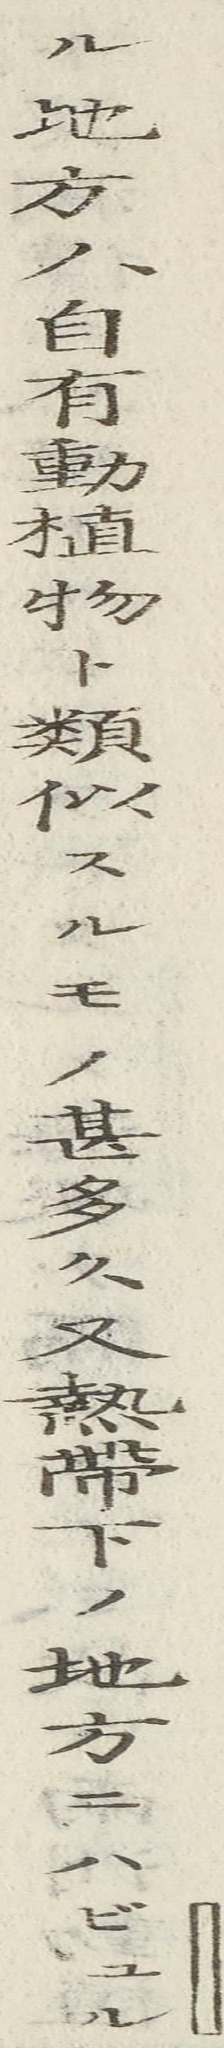ル地方ノ、自有動植物ト類似スルモノ甚多ク、又熱帯下ノ地方ニハビユル
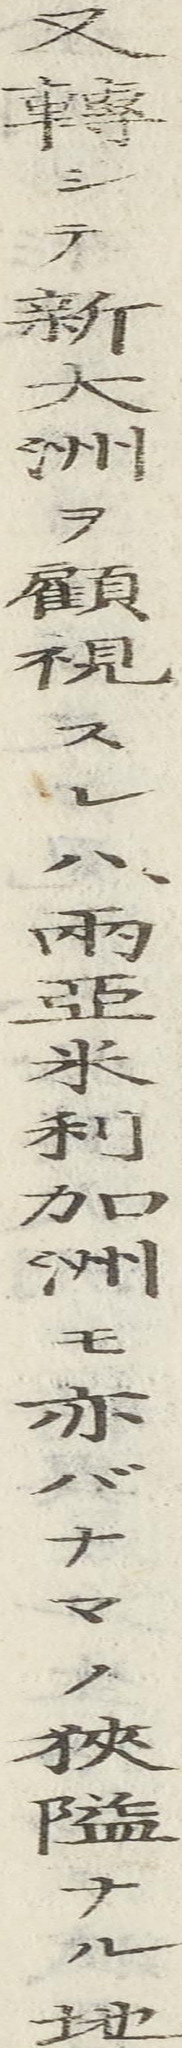又転シテ新大洲ヲ顧視スレハ、両亜米利加洲モ亦バナマノ狭隘ナル地
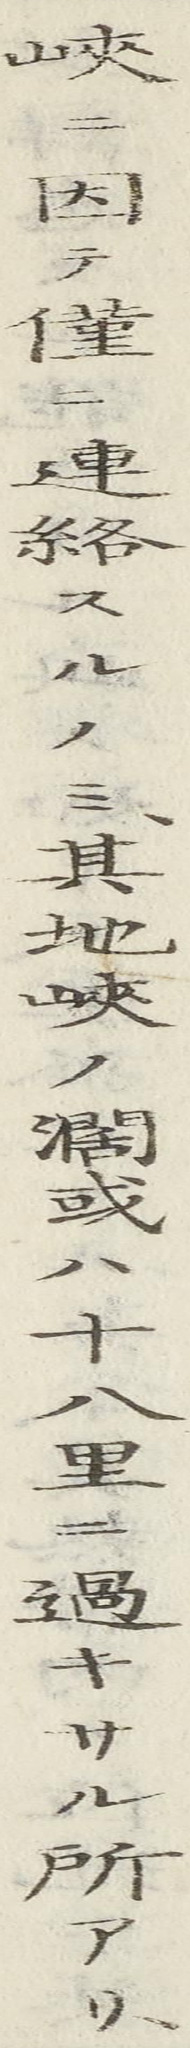峡ニ因テ僅ニ連絡スルノミ、其地峡ノ濶或ハ十八里ニ過キサル所アリ、
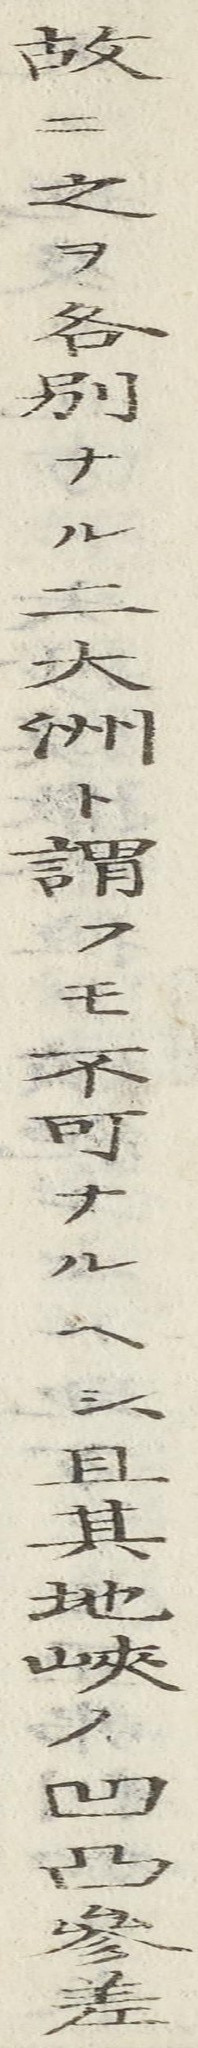故ニ之ヲ各別ナルニ大洲ト謂フモ不可ナルヘシ、且其地峡ノ凹凸参差
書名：百科全書　地文學　全
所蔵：東京大学地震研究所図書室 Earthquake Research Institute Library, The University of Tokyo, JAPAN
